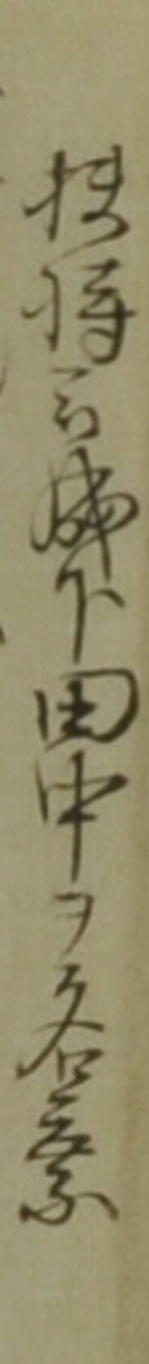扶持被成下田中ヲ名乗
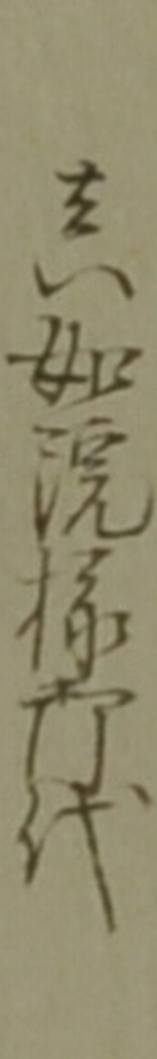真如院様御代
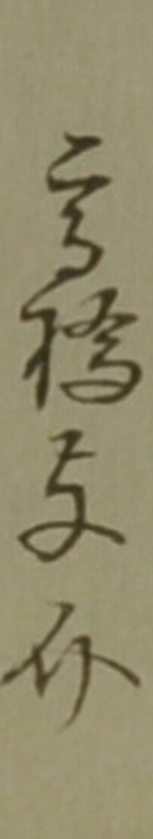高橋与介
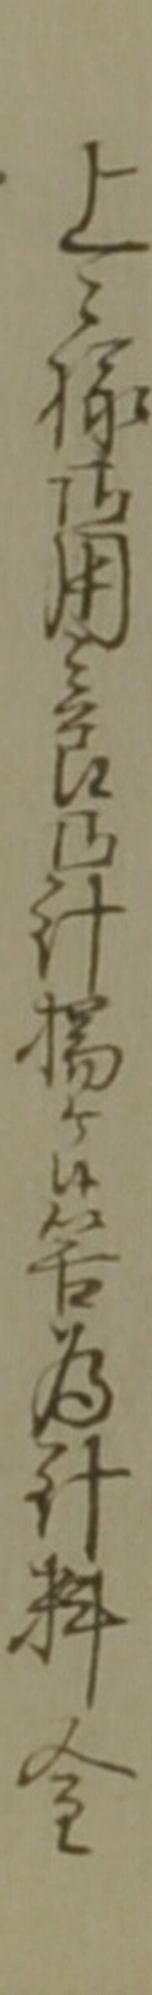上々様御用之節御針揚候筈為針料金
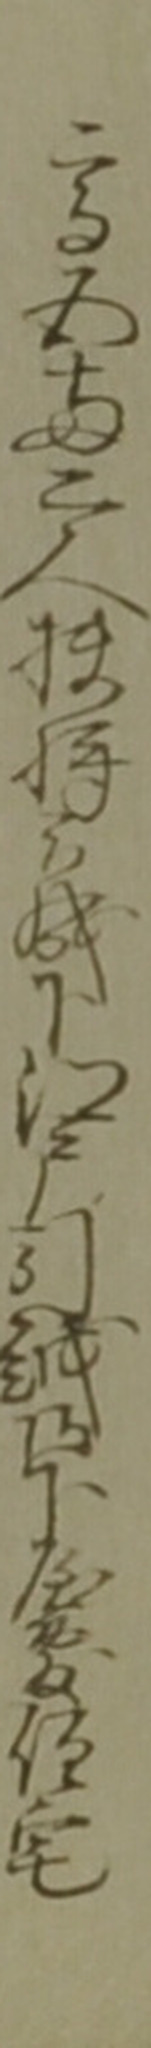高五両二人扶持被成下江戸引越御下屋敷住宅
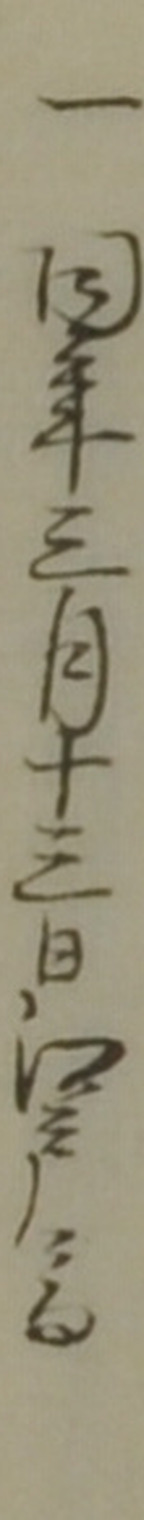一同年三月十三日江戸ニ而
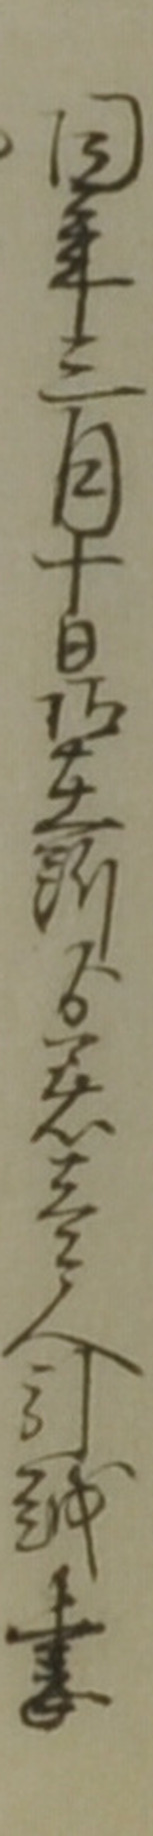一同年三月十日御在所ゟ着壱人引越妻
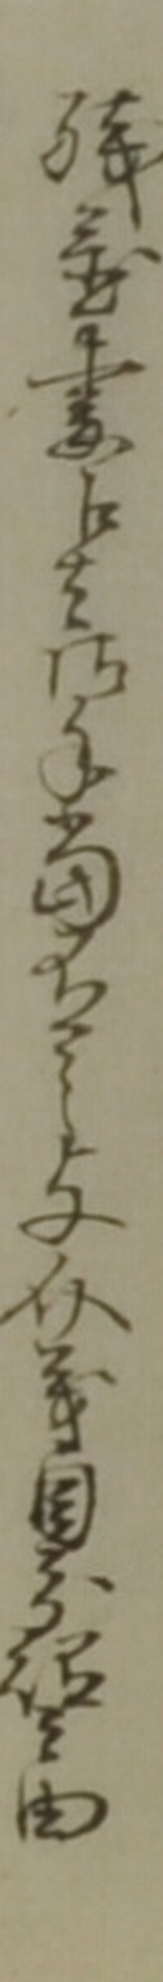残置妻江者御手当有之与介義目分賄之由
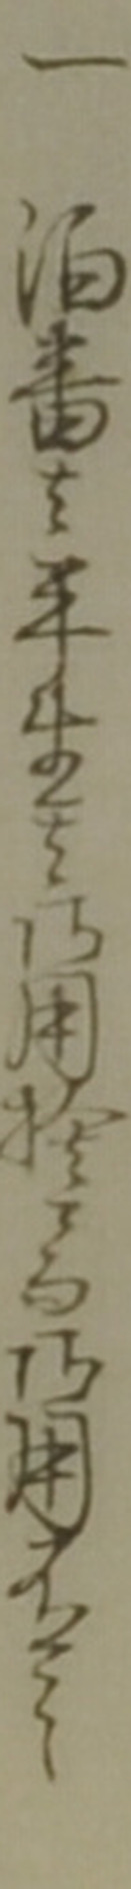一泊番者半置者御用捨ニ而御用有之
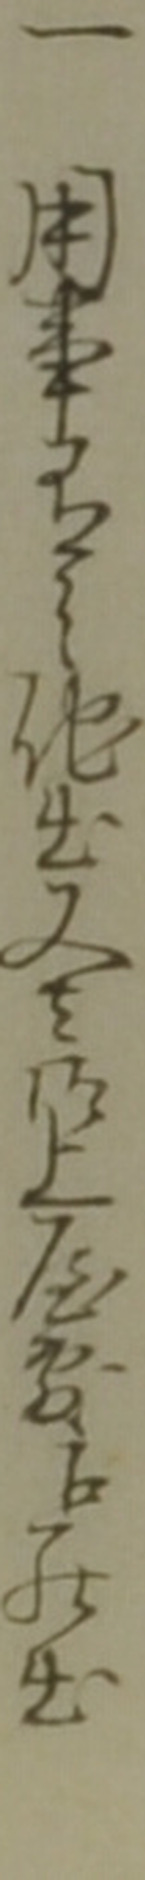一用事有之他出又者御上屋敷江罷出
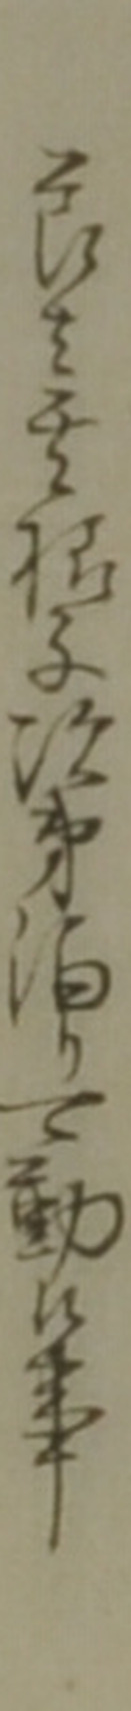節者其様子次第泊可勤候事

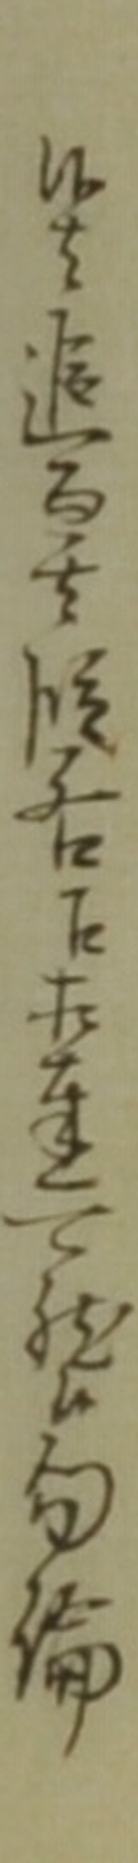候者追而其段各江相達可然候勿論
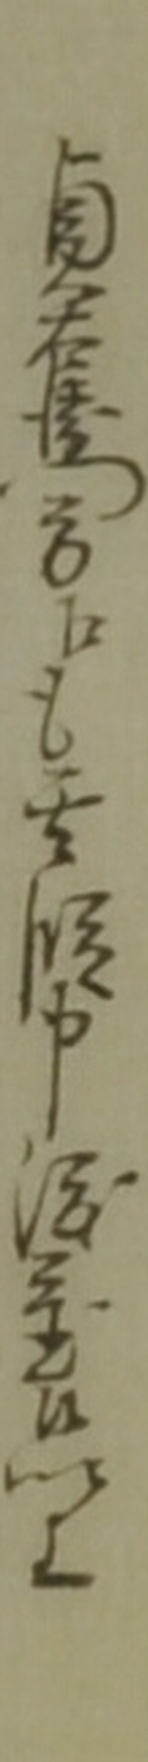貞右衛門方江も其段申渡置候以上
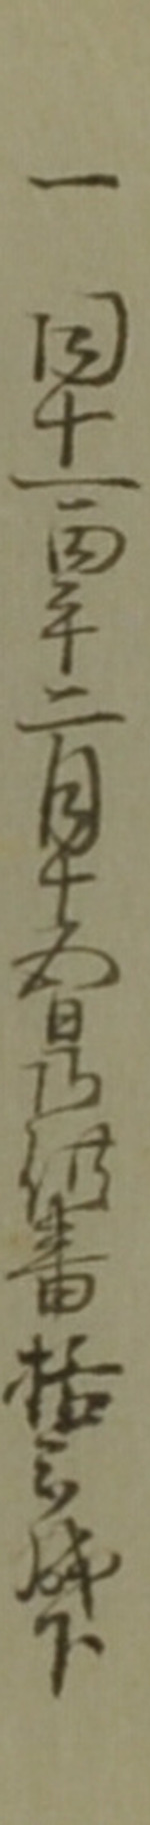一同十一丙午二月十五日御供番格被成下
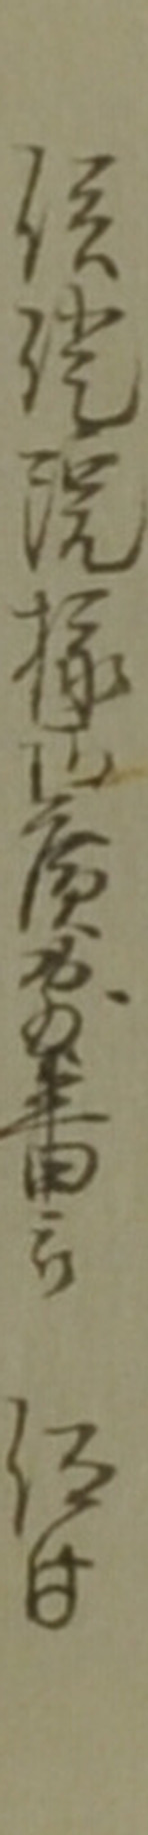信証院様御広敷番被仰付
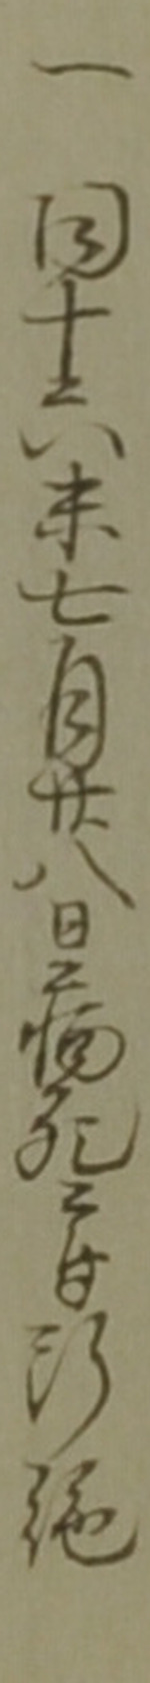一同十六未七月廿八日病死ニ付断絶
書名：無足廃家（壱）
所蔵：伊那市立高遠町図書館・合同会社AMANE
